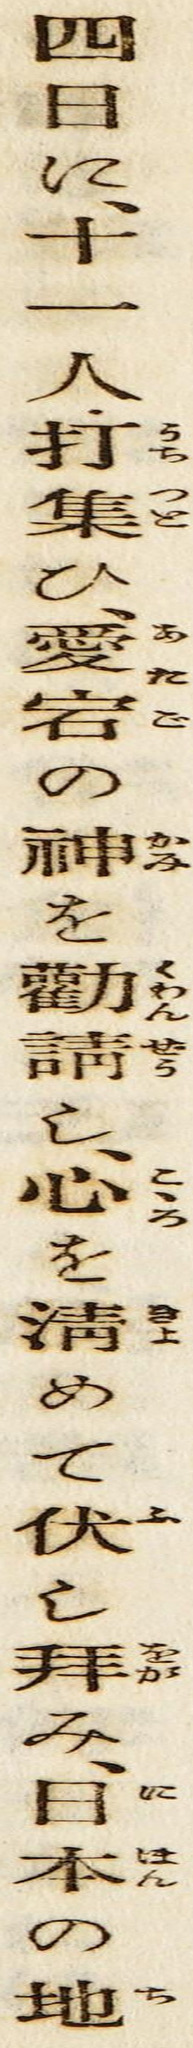四日に、十一人打集ひ、愛宕の神を勧請し、心を清めて伏し拝み、日本の地
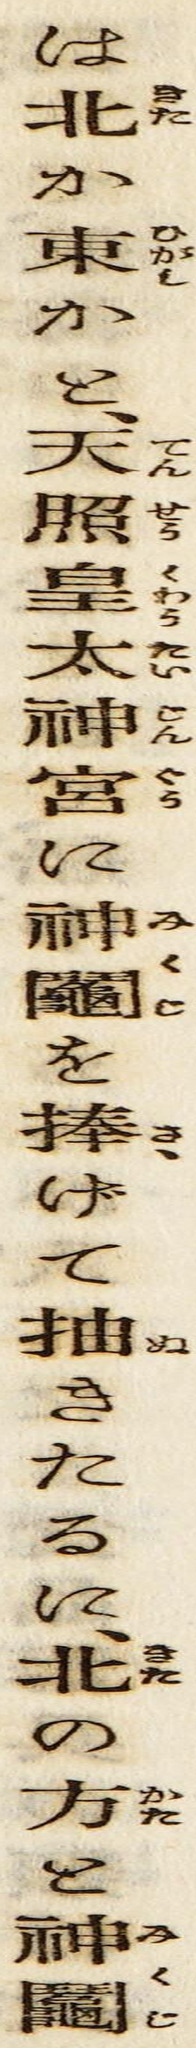は北か東かと、天照皇太神宮に神鬮を捧げて抽きたるに、北の方と神鬮
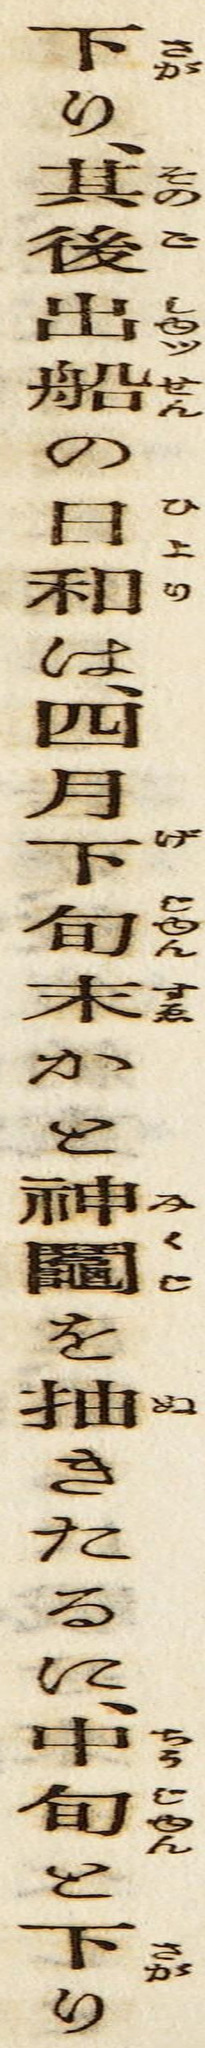下り、其後出船の日和は、四月下旬末かと神鬮を抽きたるに、中旬と下り

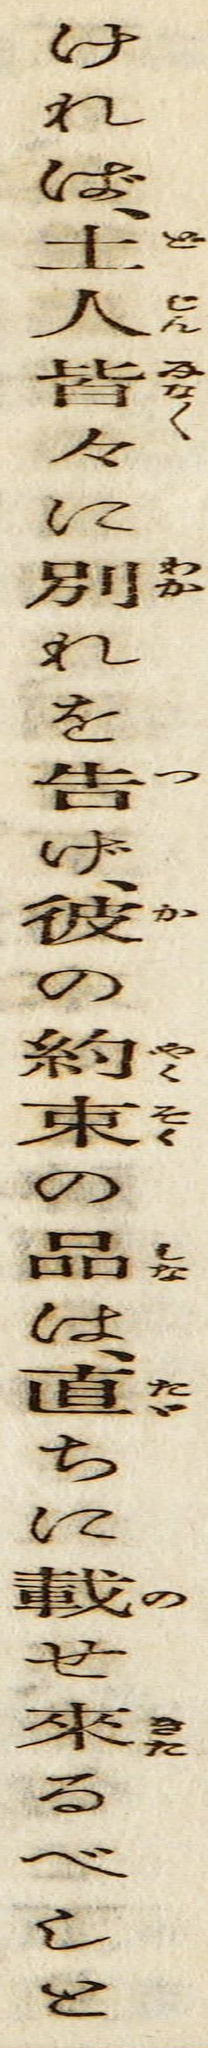ければ、土人皆々に別れを告げ、彼の約束の品は、直ちに載せ来るべしと
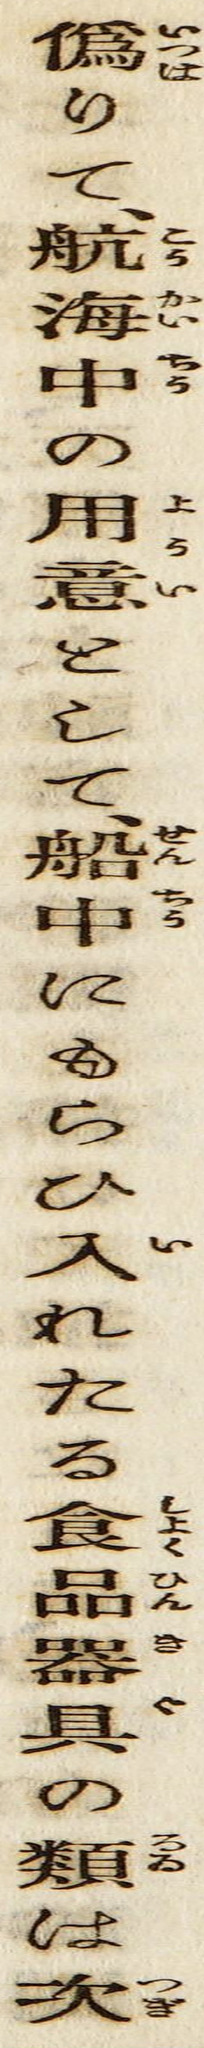偽りて、航海中の用意として、船中にもらひ入れたる食品器具の類は次
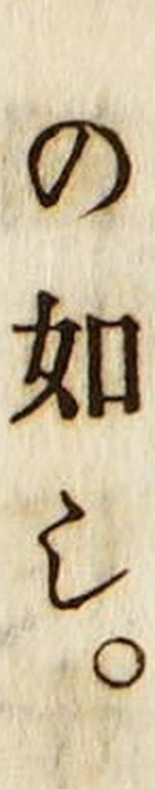の如し。
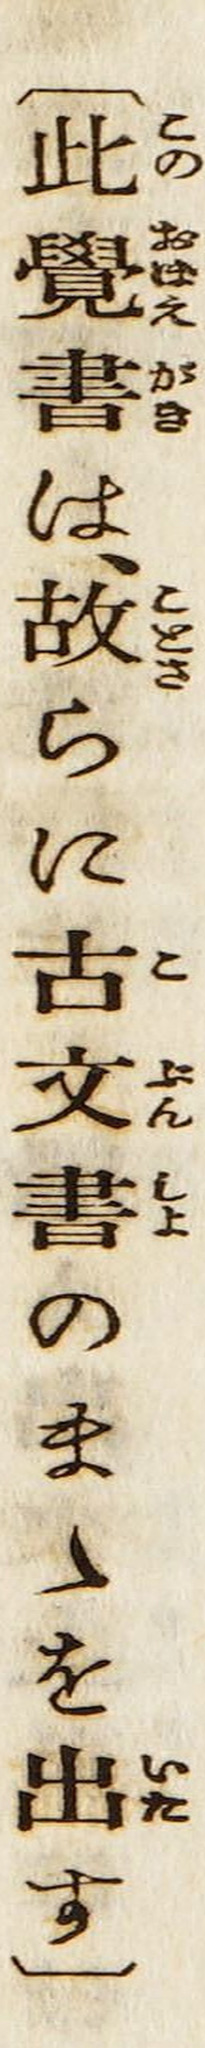覚。[此覚書は、故らに古文書のまゝを出す]
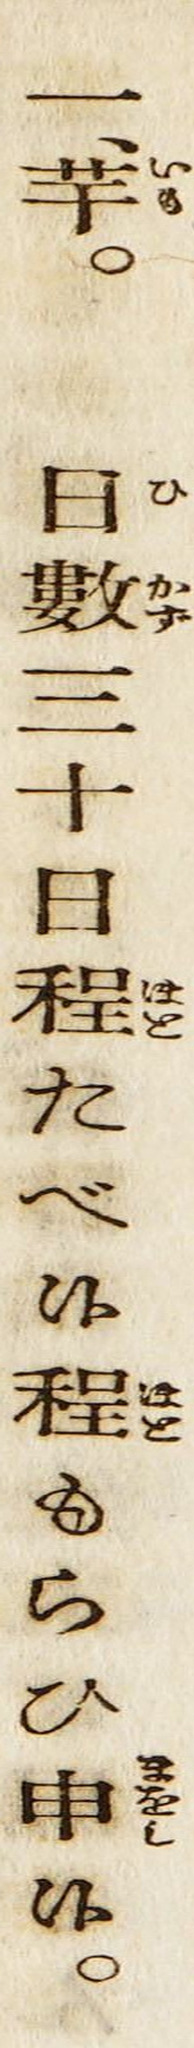一、芋。日数三十日程たべ候程もらひ申候。
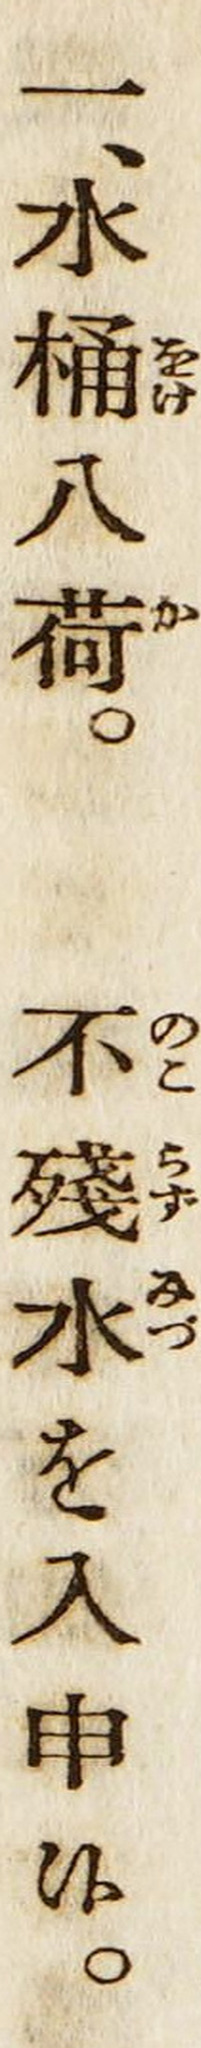一、水桶八荷。不残水を入申候。
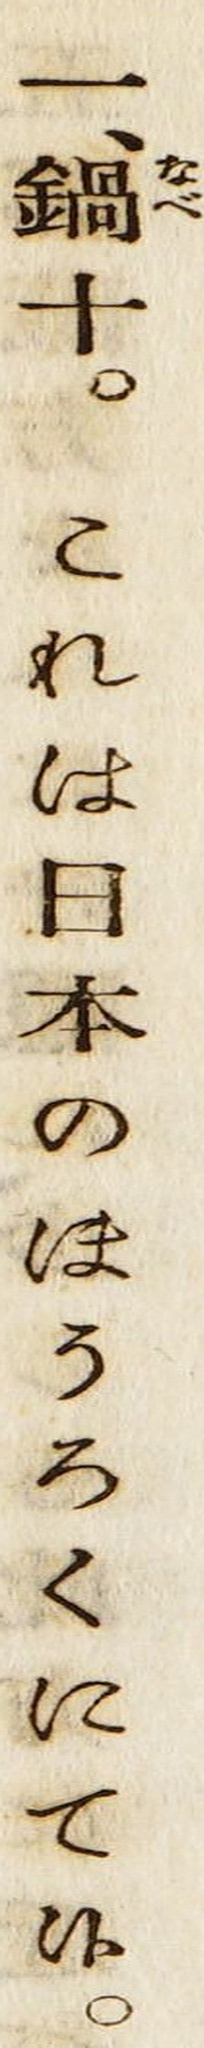一、鍋十。これは日本のほうろくにて候。
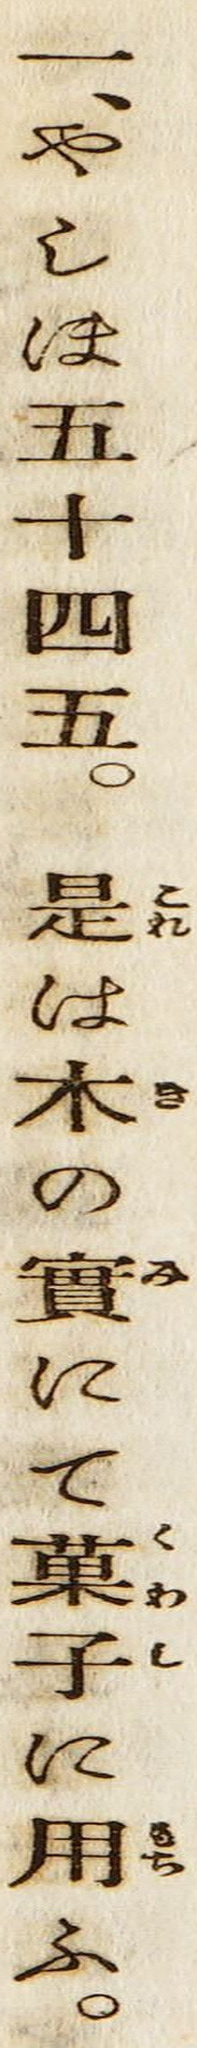一、やしほ五十四五。是は木の実にて菓子に用ふ。
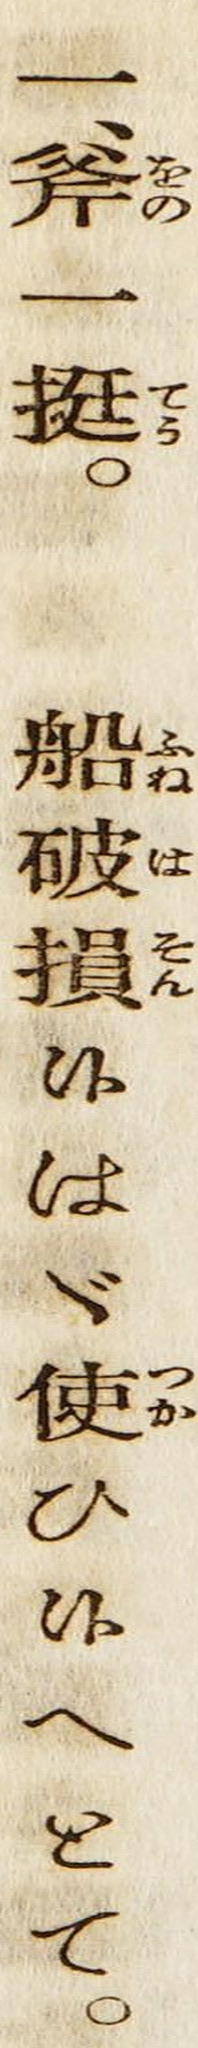一、斧一挺。船破損候はヾ使ひ候へとて。
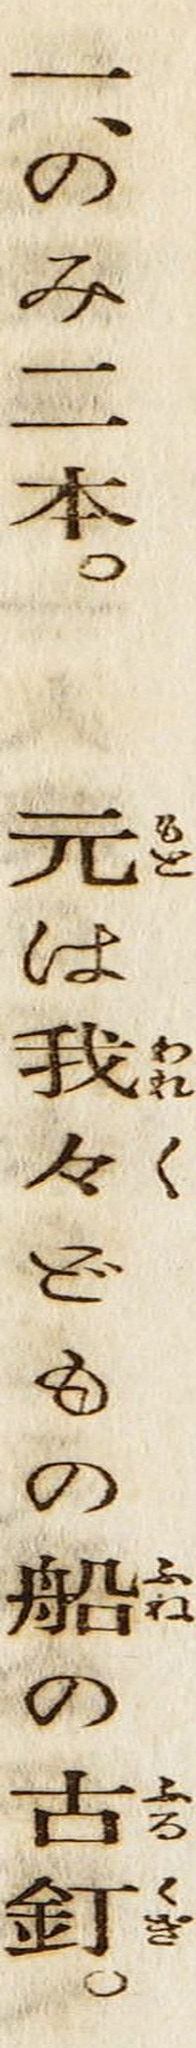一、のみ二本。元は我々どもの船の古釘。
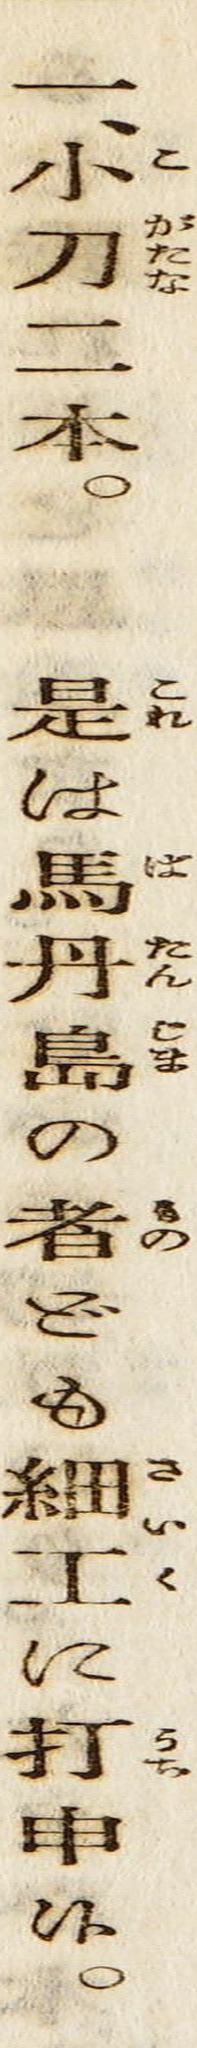一、小刀二本。是は馬丹島の者ども細工に打申候。
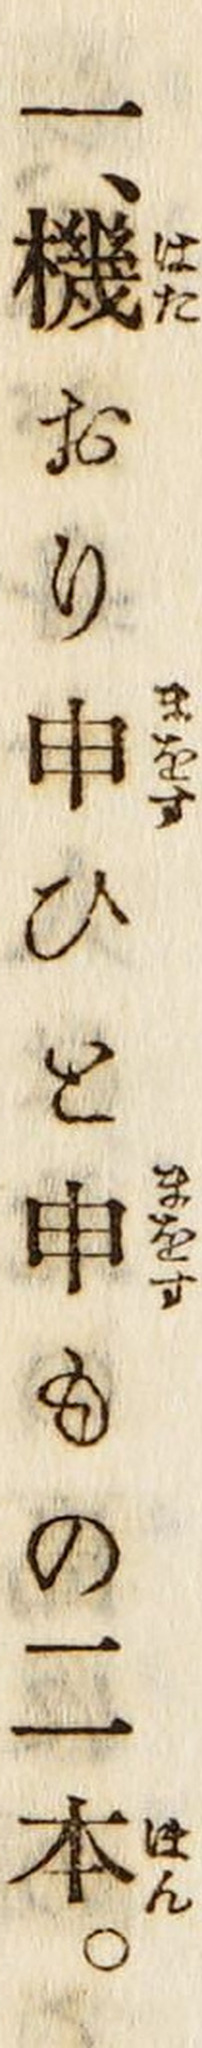一、機おり申ひと申もの二本。
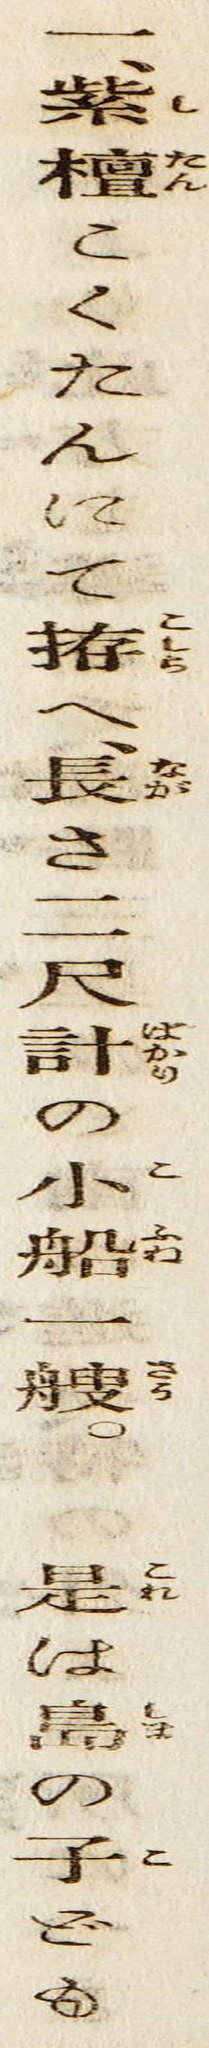一、紫檀こくたんにて拵へ、長さ二尺計の小船一艘。是は島の子ども
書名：日本漂流譚
